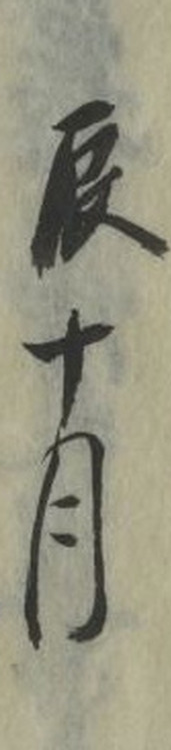辰十月
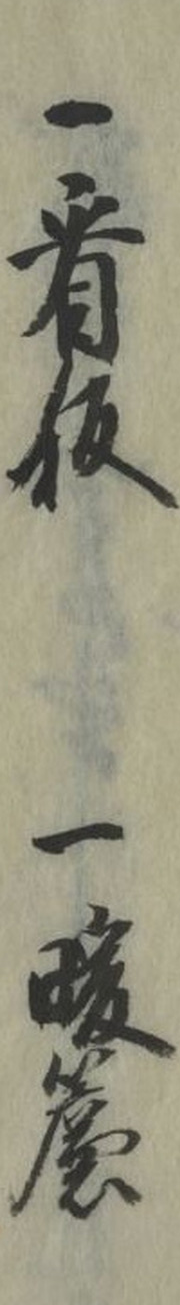一看板一暖簾
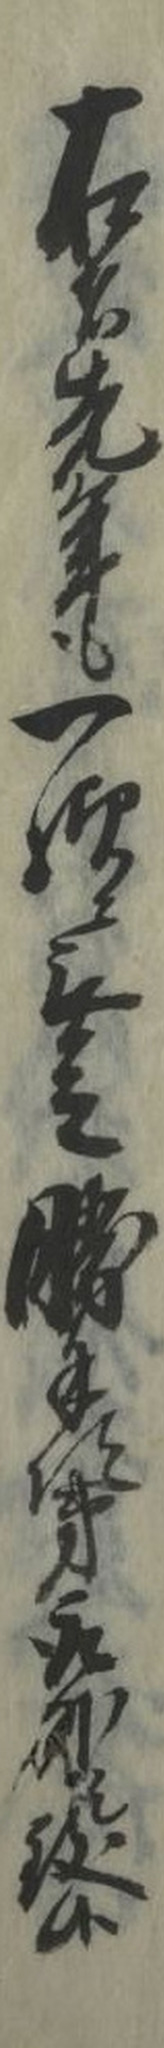右は先年も一様に無之勝手次第取外し致候

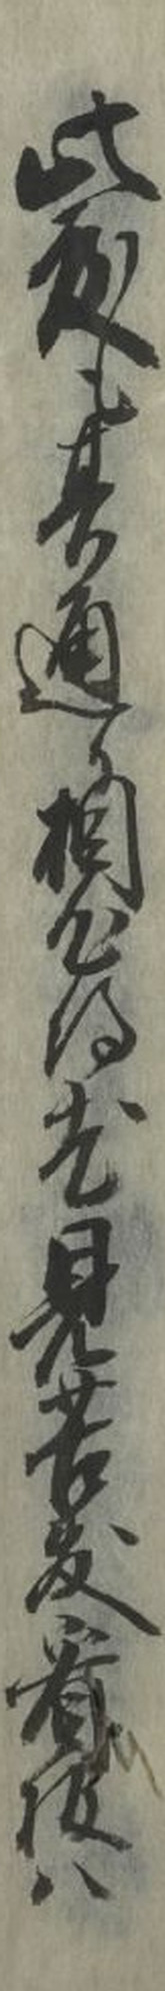此度も其通り相心得尤見苦敷看板は
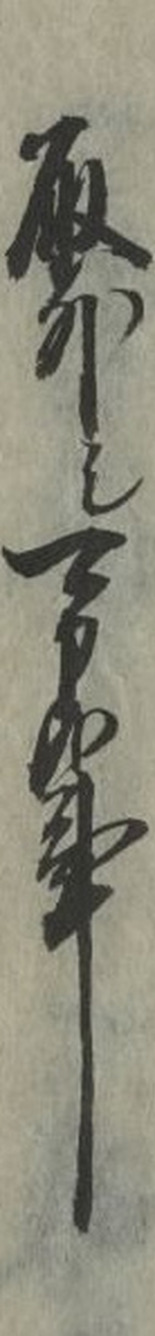取外し可申候事
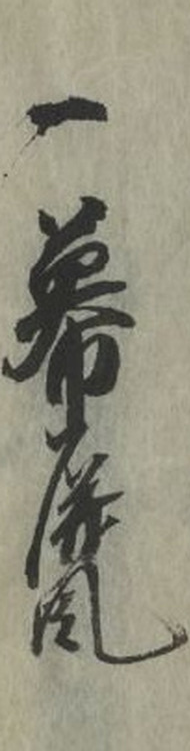一幕屏風
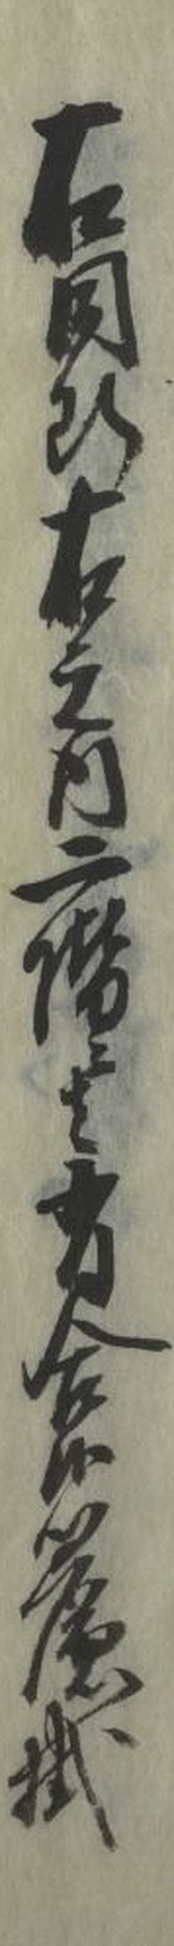右同断右之内二階には有合候簾掛
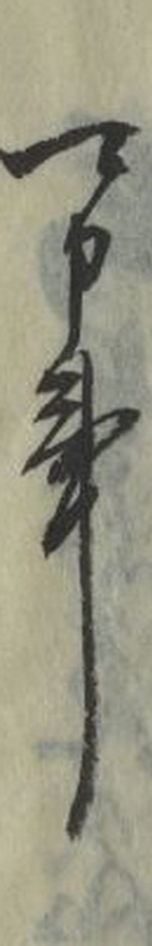可申事
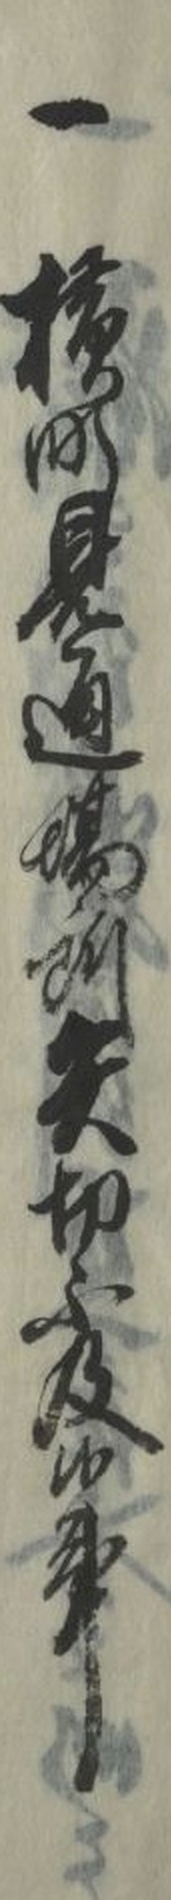一横町見通場所矢切不及候事
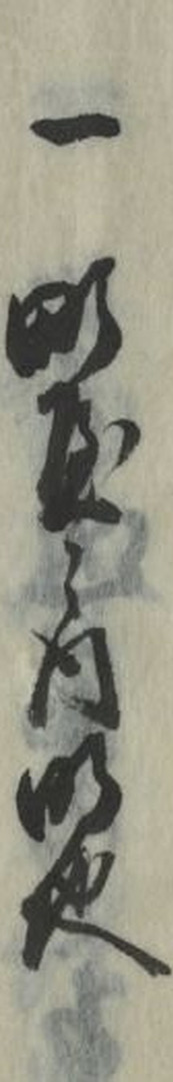一町屋之内明地
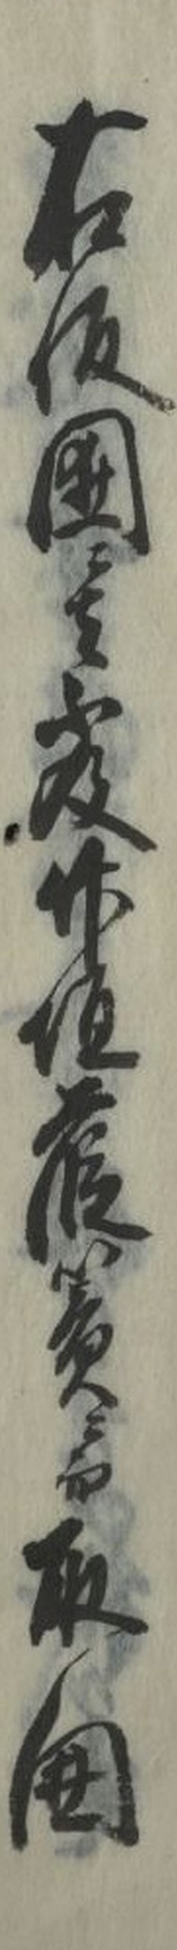右仮囲には不及竹垣葭簀に而取囲
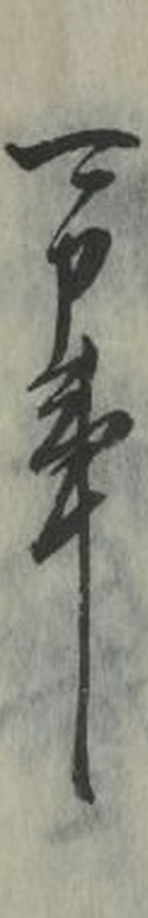可申事
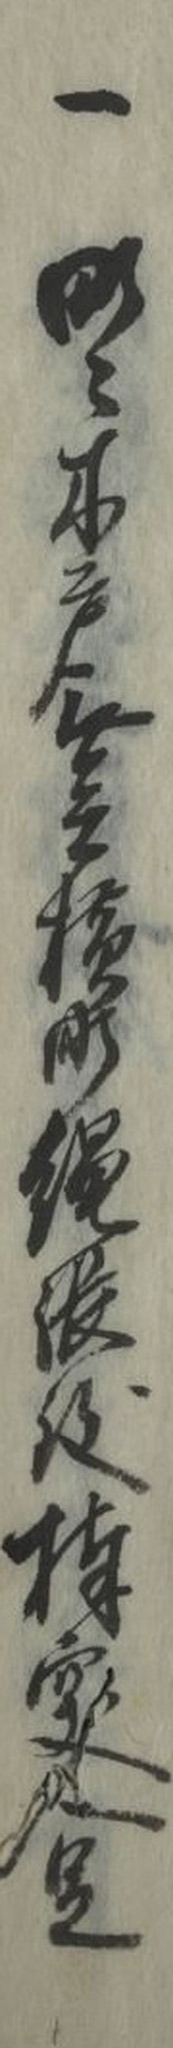一町々木戸無之横町縄張致棒突人足

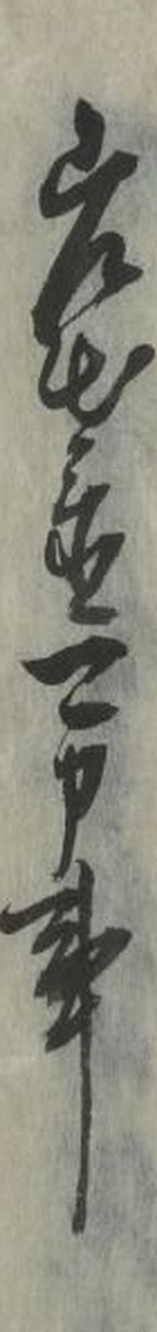差出置可申事
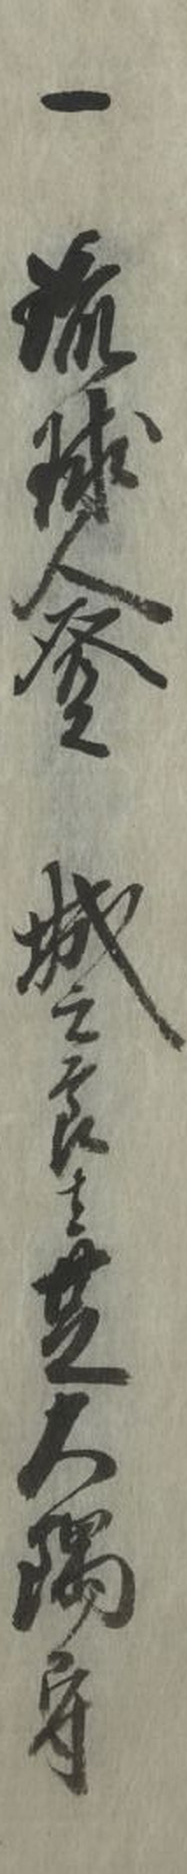一琉球人登城之節は芝大隅守
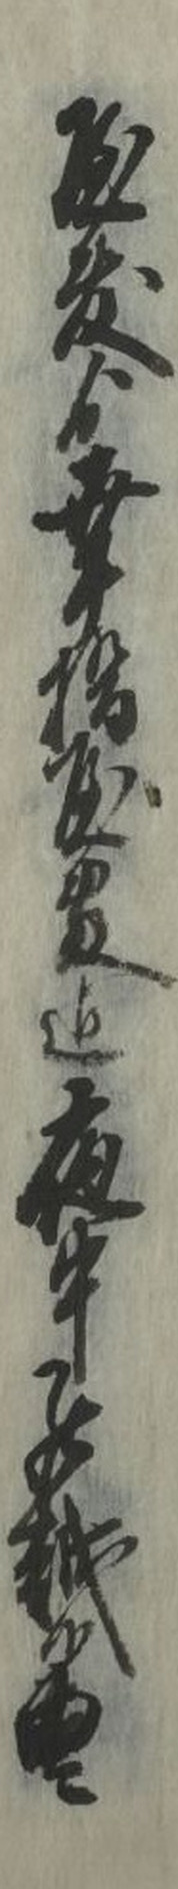屋敷ゟ幸橋屋敷迄夜中罷越候由に
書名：天保三壬辰年・琉球人参府・弐朱吹立御触写
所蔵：University of the Ryukyus Library
